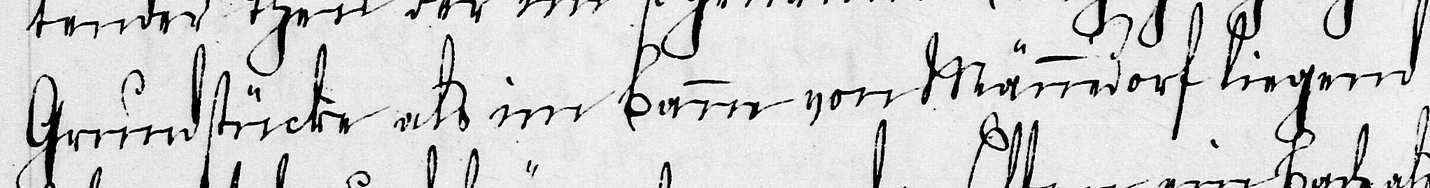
Grundstücke als im Banne von Männedorf liegend
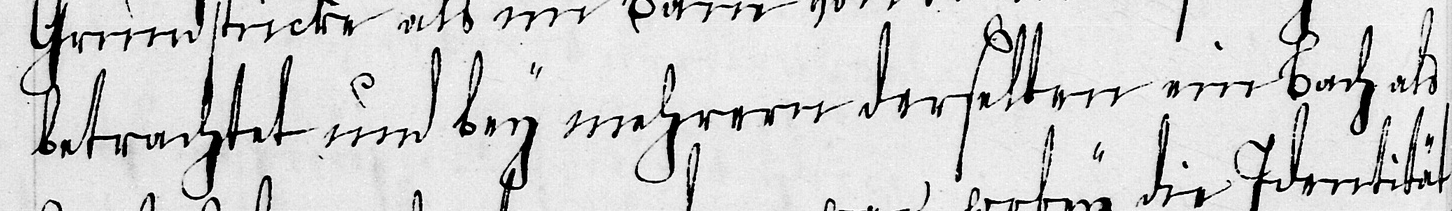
betrachtet und bey mehrern denselben ein Bach als
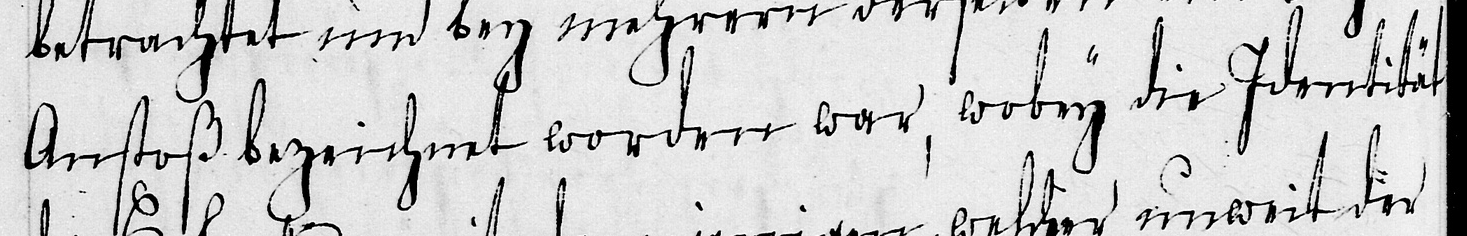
Anstoß bezeichnet worden war, wobey die Identität
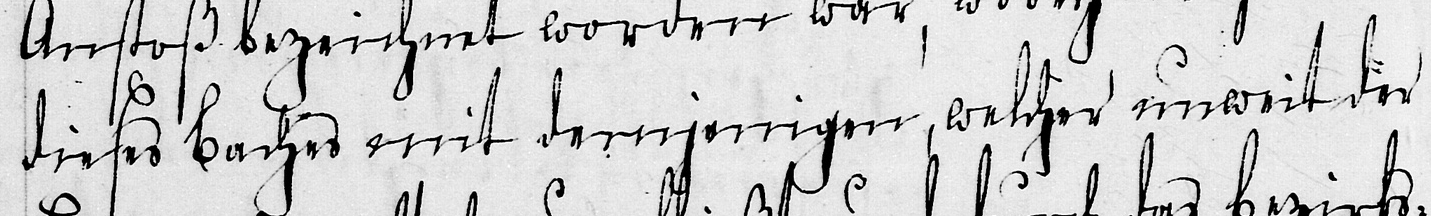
dieses Baches mit demjenigen, welcher unweit der
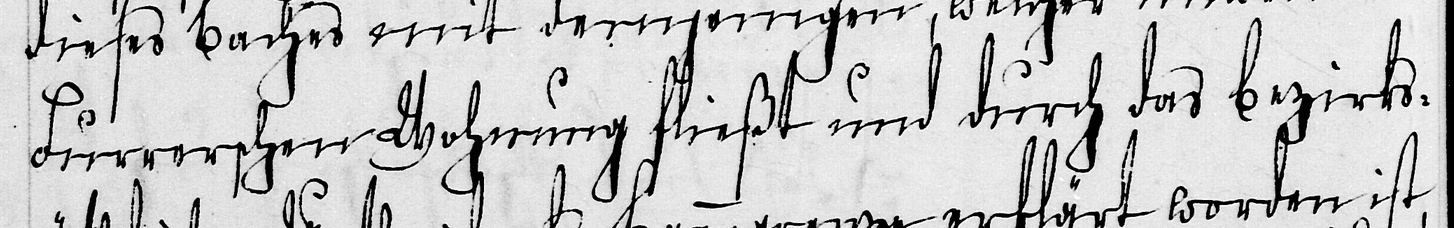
Furrerschen Wohnung fließt und durch das bezirks¬
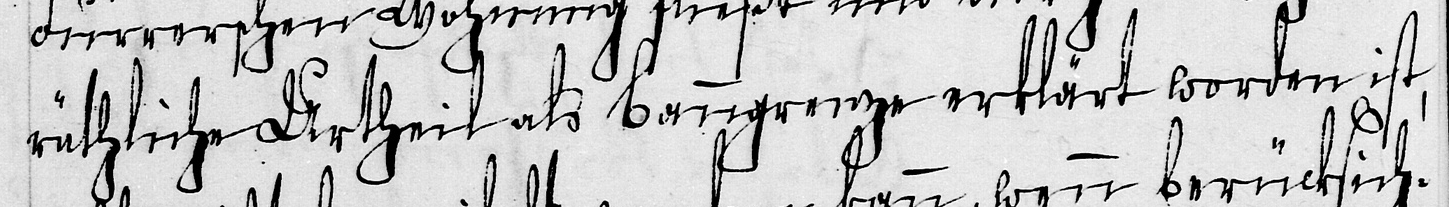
räthliche Urtheil als Banngrenze erklärt worden ist,
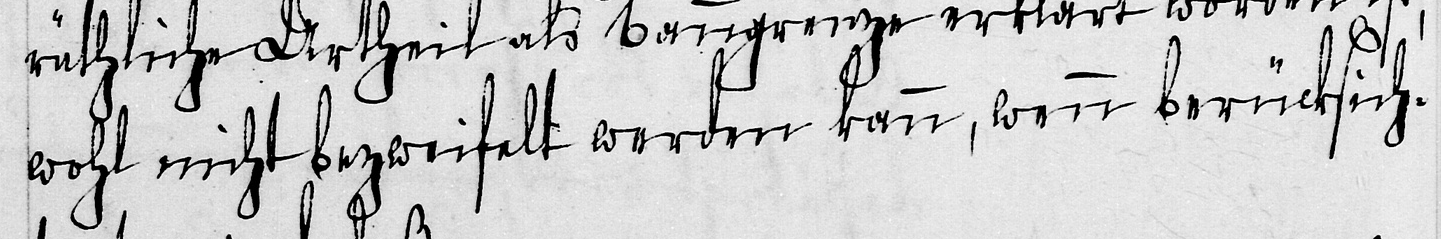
wohl nicht bezweifelt werden kann, wenn berücksich¬
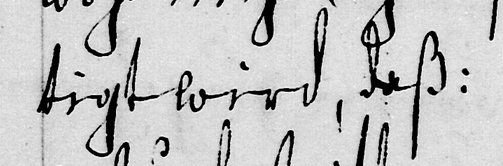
tigt wird, daß:
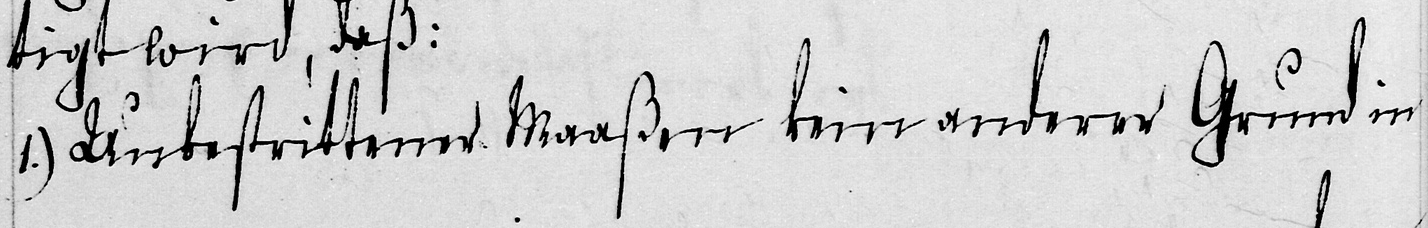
1.) Unbestrittener Maaßen kein anderer Grund in
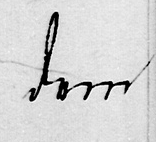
den¬
